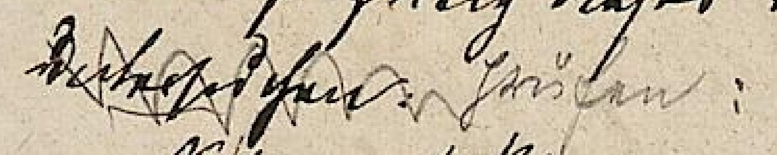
untersuchen: prüfen:
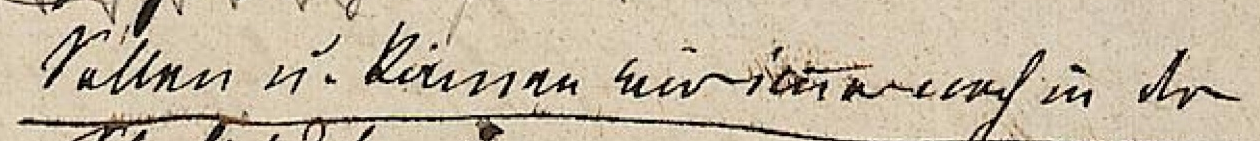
Sollen u. können wir imernoch in der
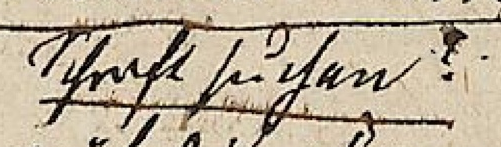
Schrift suchen?
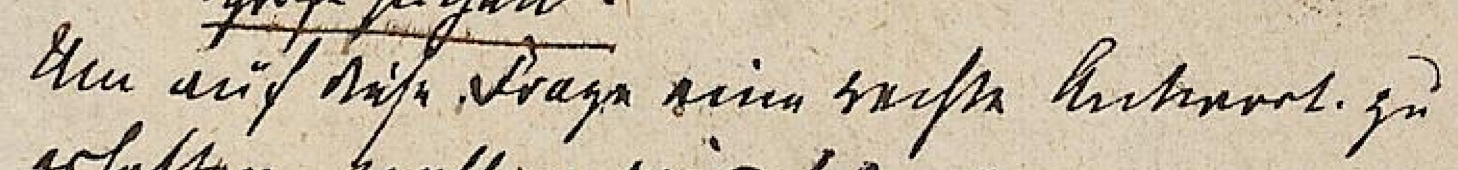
Um auf diese Frage eine rechte Antwort. zu
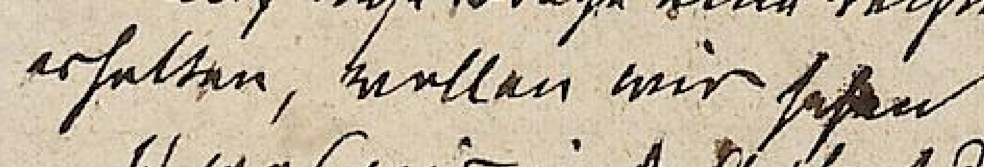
erhalten, wollen wird sehen
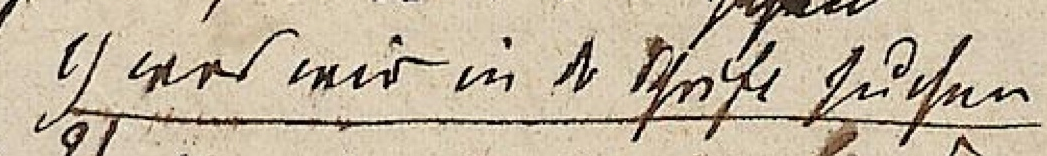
1) was wir in da Schrift suchen
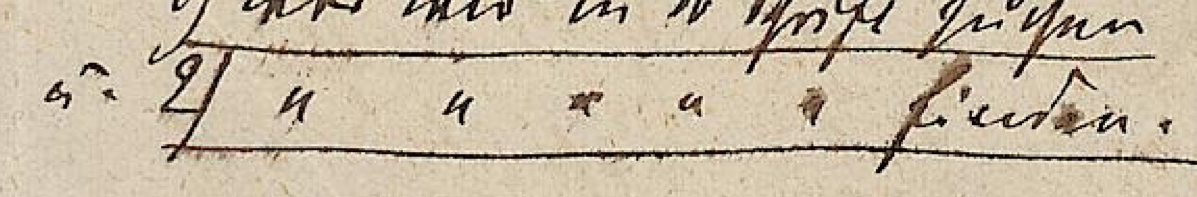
u. 2) " " " " " finden.
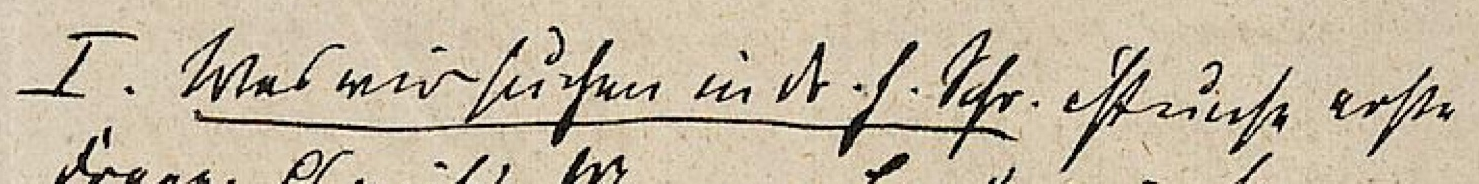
I. Was wir suchen in dr. H. Schr. ist unsr erste
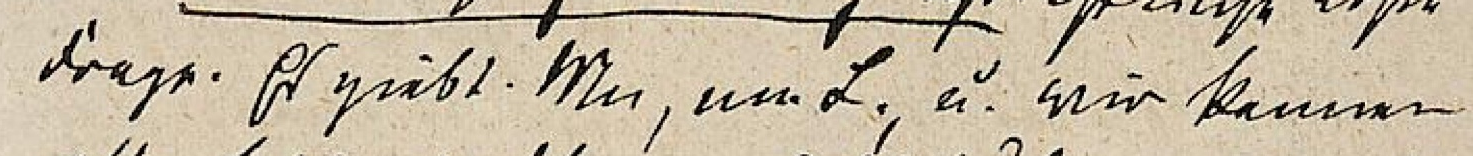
Frage. Es giebt. Mn, mn. L., . u. wir kennen
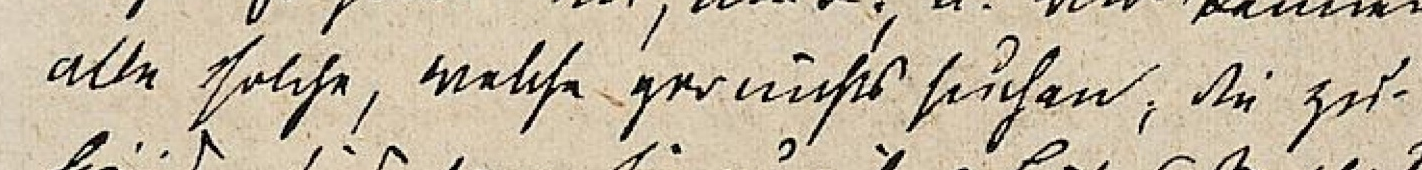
alle solche, welche garnichts suchen, die zu¬
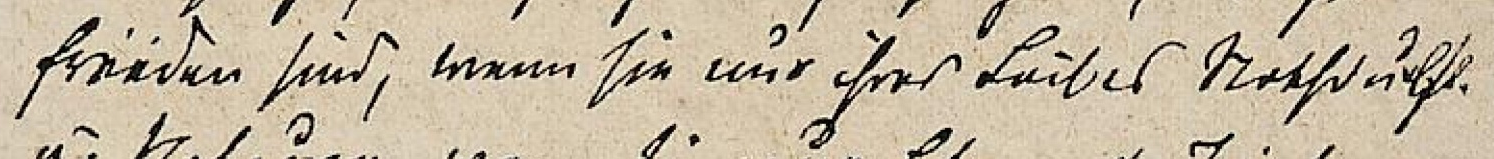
frieden sind, wenn sie nur ihres Leibes Nothdurft
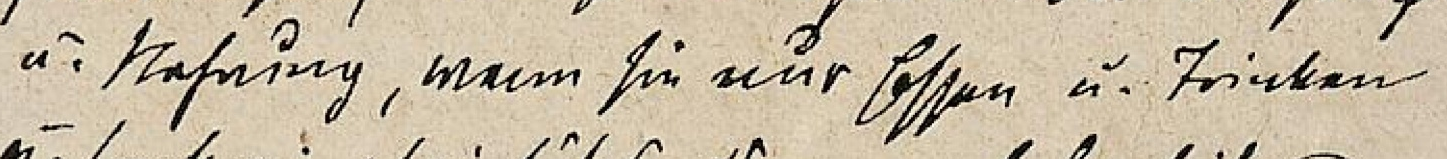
u. Nahrung, wenn sie nur Essen u. Trinken
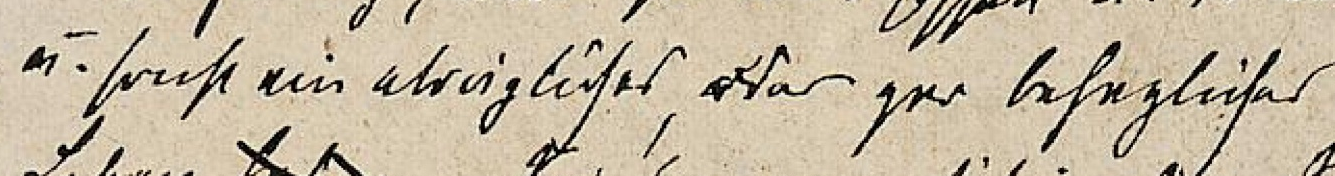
u. sonst ein erträgliches, oder gar behagliches
